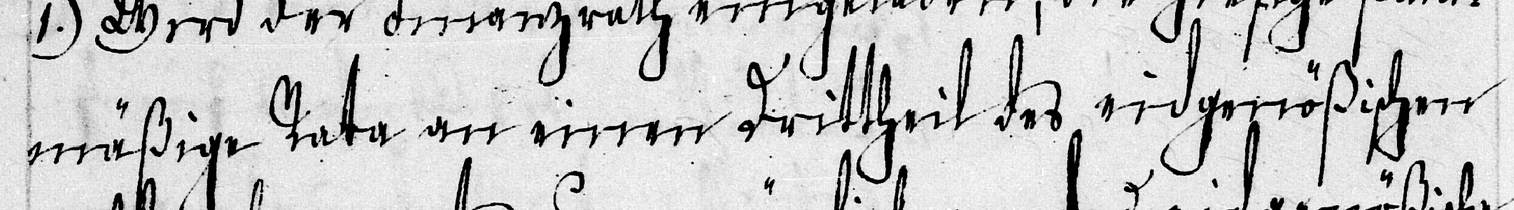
mäßige Rata an einen Drittheil des eidgenößischen
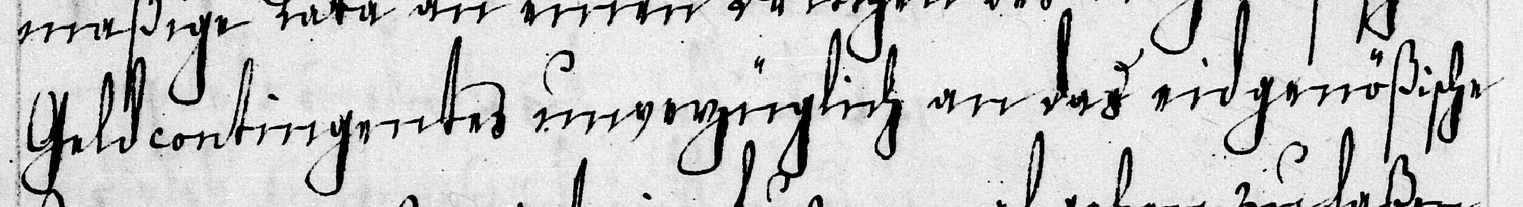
Geldcontingentes unverzüglich an das eidgenößische
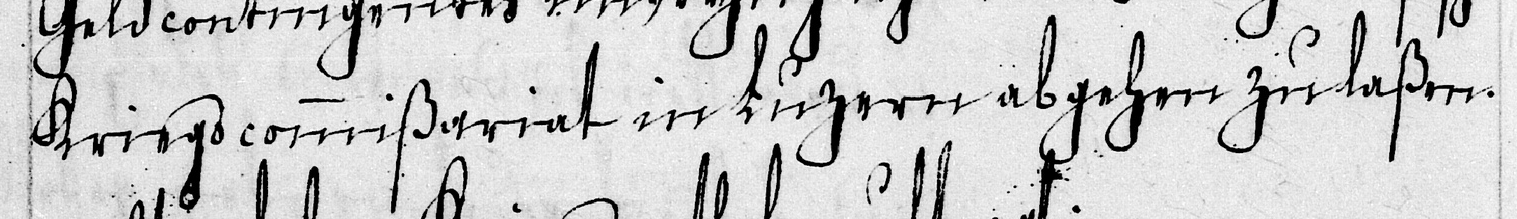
Kriegscommißariat in Luzern abgehen zu laßen.
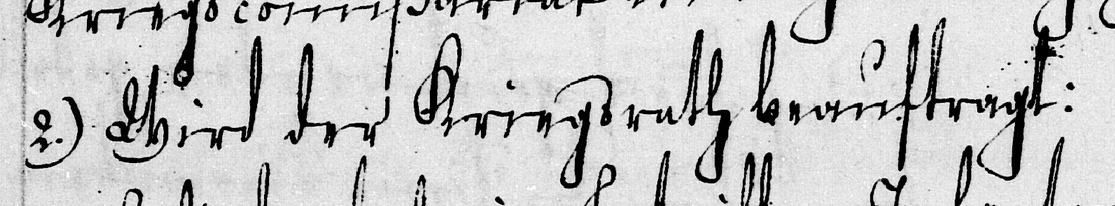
2.) Wird der Kriegsrath beauftragt:
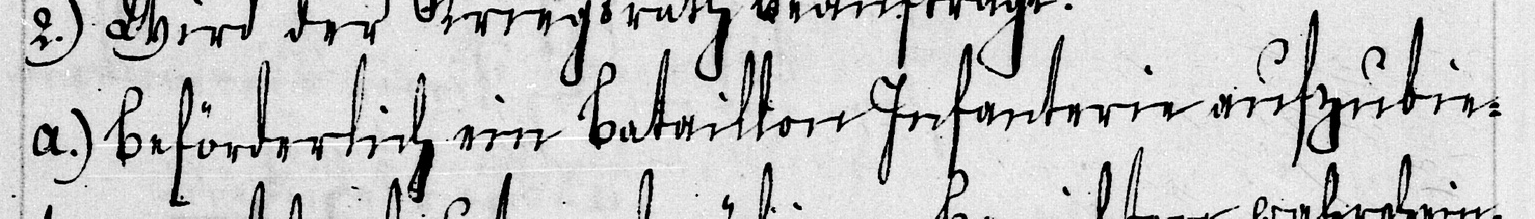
a.) Beförderlich ein Bataillon Infanterie aufzubie¬
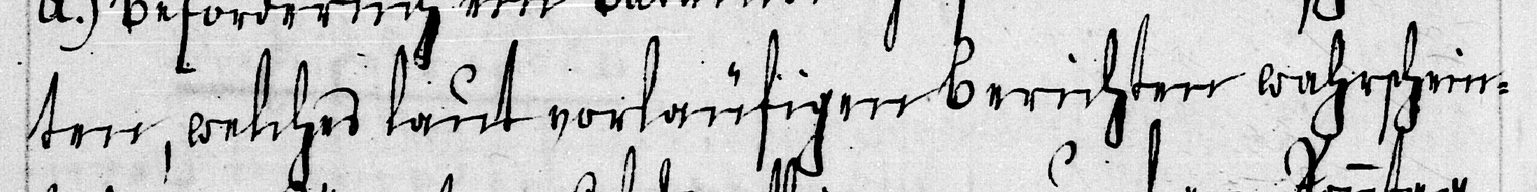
ten, welches laut vorläufigen Berichten wahrschein¬
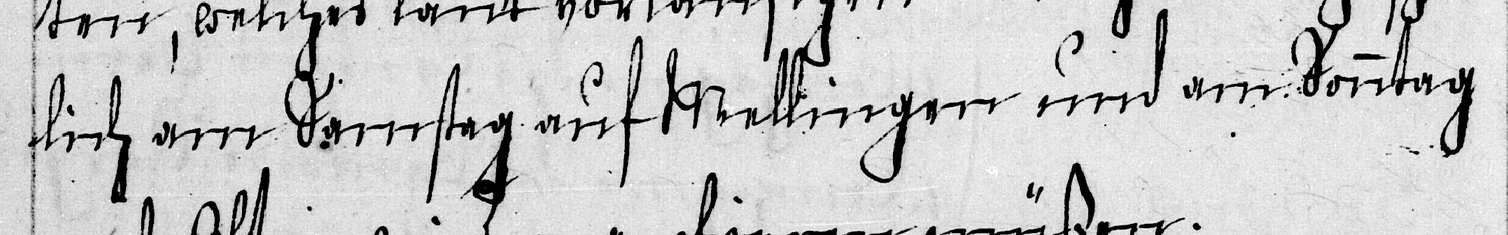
lich am Samstag auf Mellingen und am Sonntag
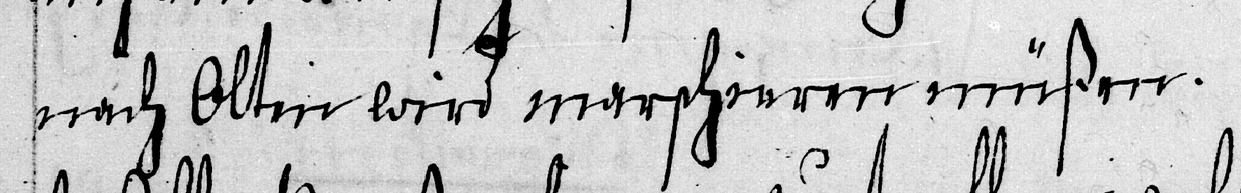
nach Olten wird marschieren müßen.
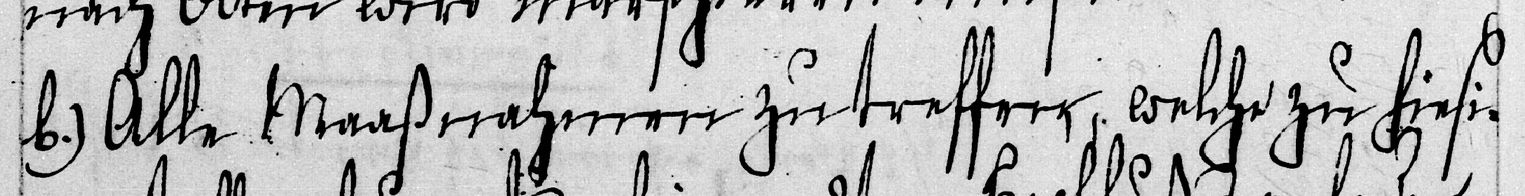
b.) Alle Maaßnahmen zu treffen, welche zu hies¬
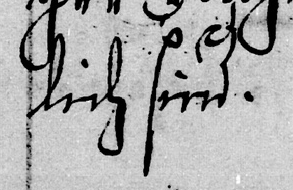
ich sin¬
